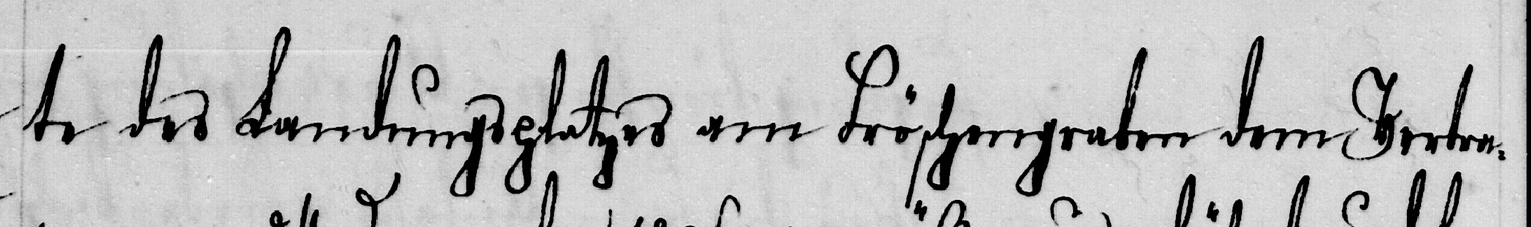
te des Landungsplatzes am Fröschengraben dem Vertra¬
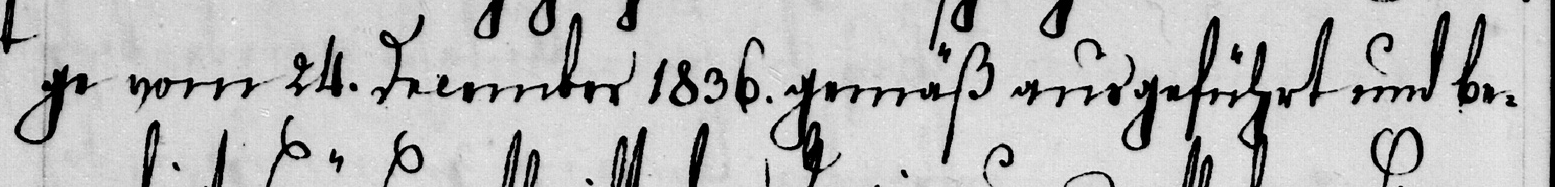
ge vom 24. December 1836. gemäß ausgeführt und be¬
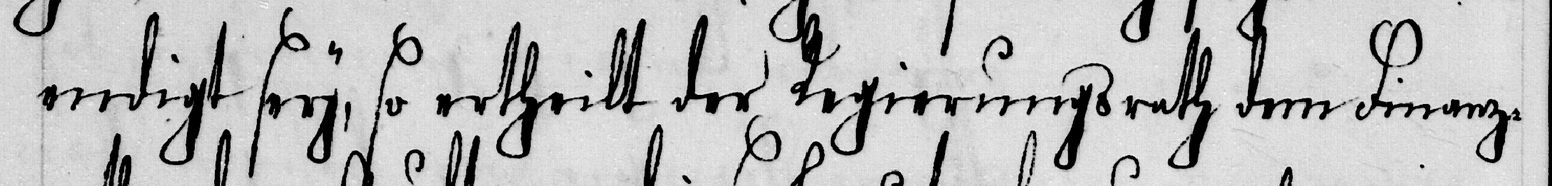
endigt sey, so ertheilt der Regierungsrath dem Finanz¬
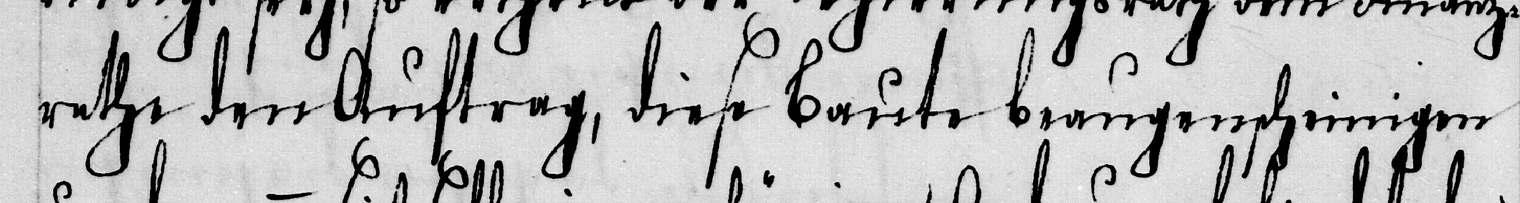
rathe den Auftrag, diese Baute beaugenscheinigen
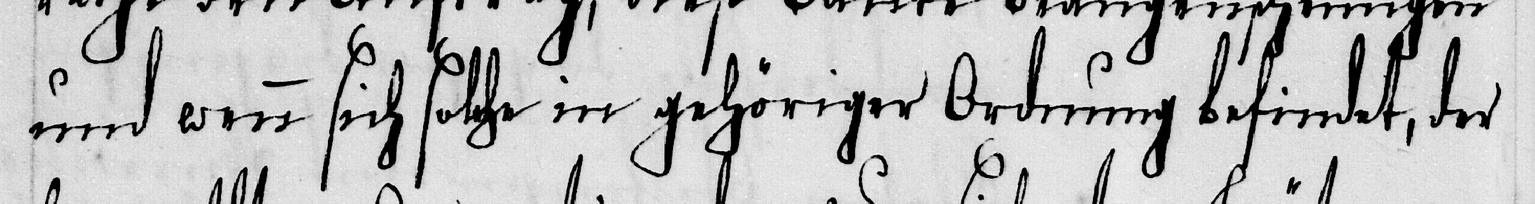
und wenn sich solche in gehöriger Ordnung befindet, der
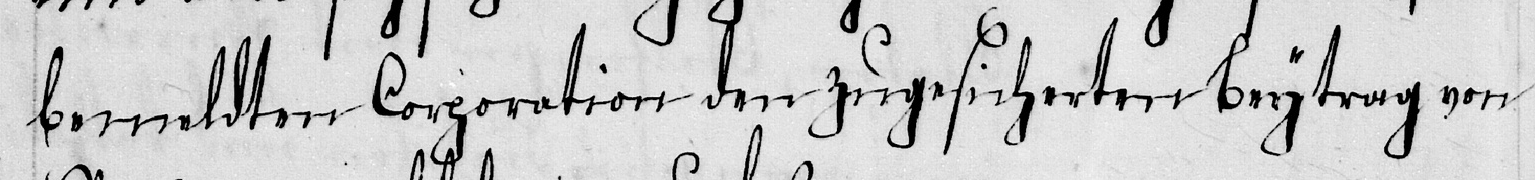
bemeldten Corporation den zugesicherten Beytrag von
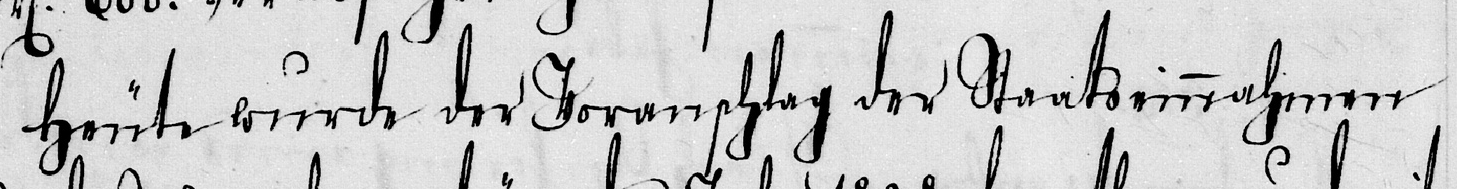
Heute wurde der Voranschlag der Staatseinnahmen
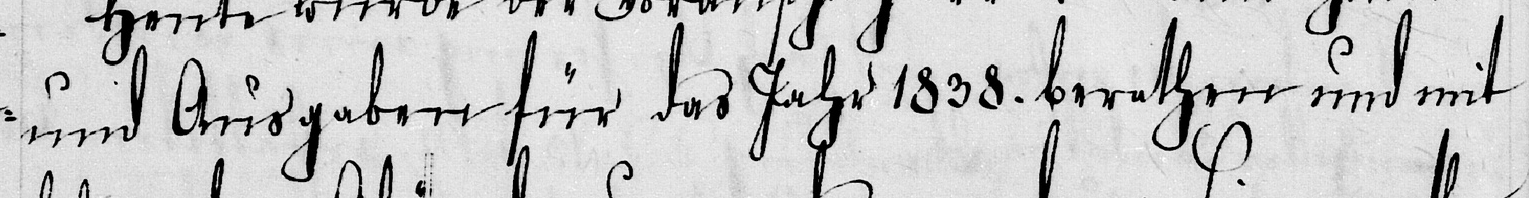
und Ausgaben für das Jahr 1838. berathen und mit
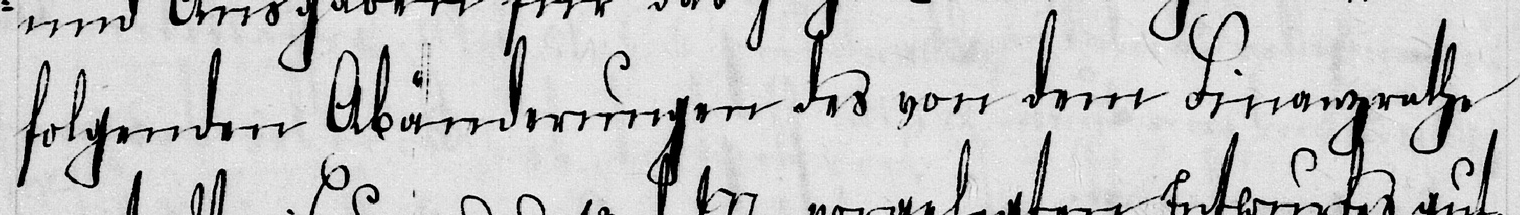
folgenden Abänderungen des von dem Finanzrathe
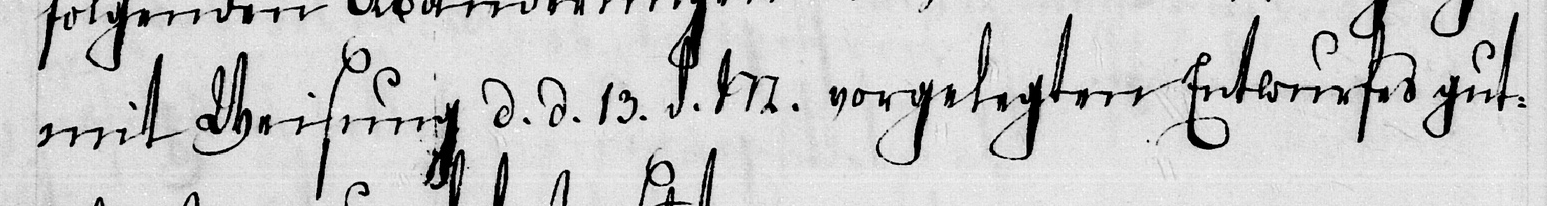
mit Weisung d. d. 13. d. M. vorgelegten Entwurfes gut¬
